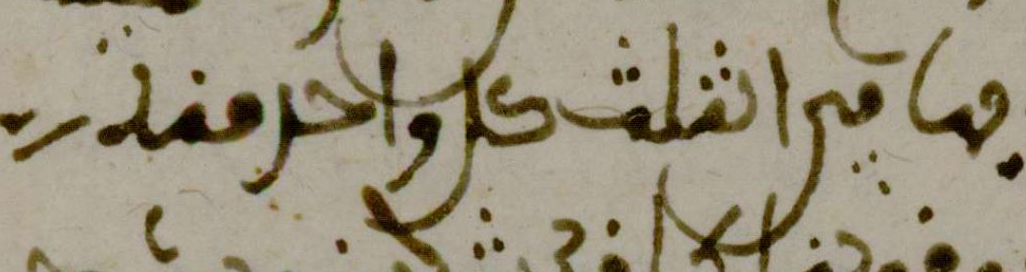بها في الثلث كل واحد منه
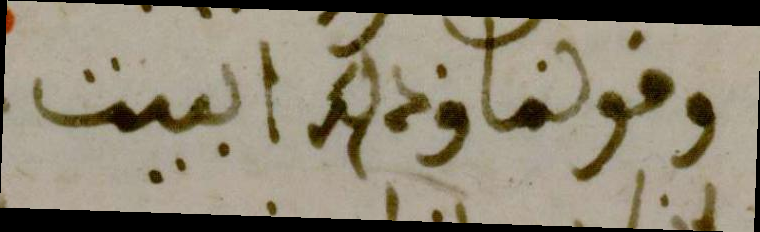وقولنا وذلك البيت
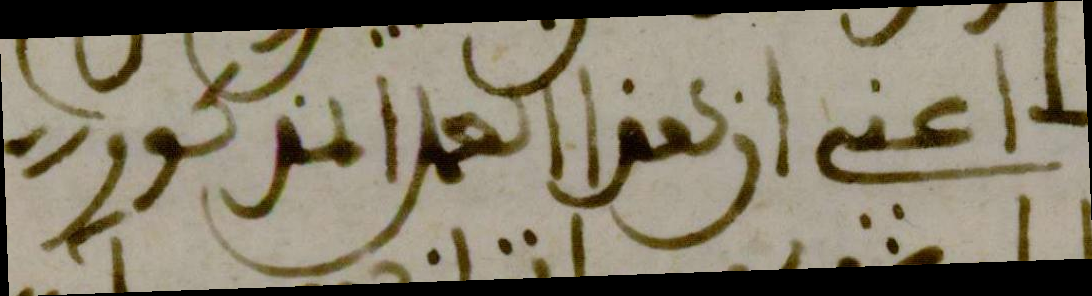اعني ان هذا العمل المذكور
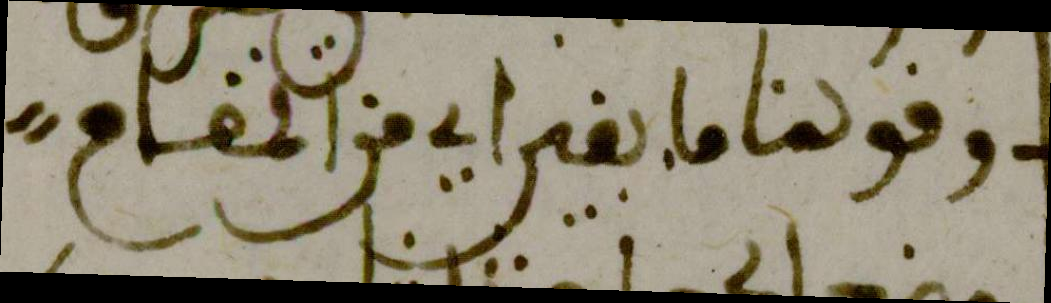وقولنا ما بقي اي من المقام
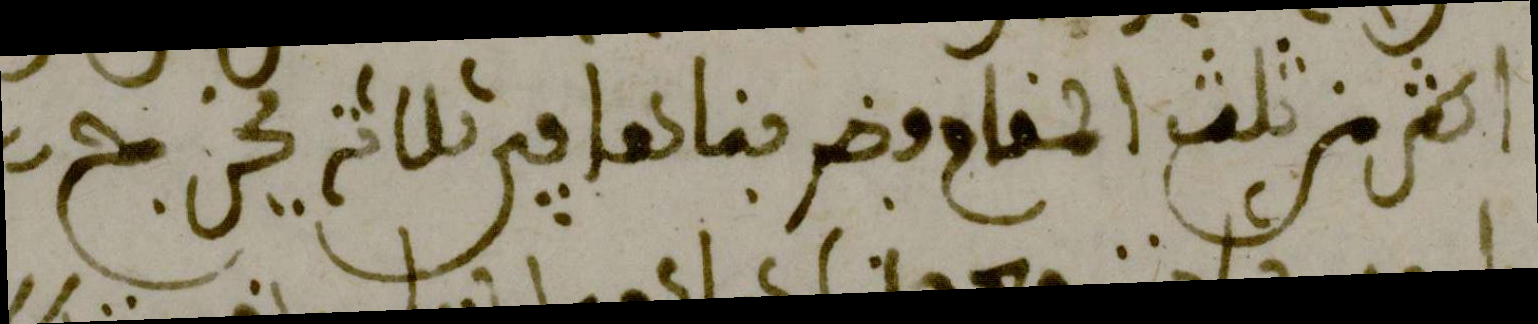اكثر من ثلث المقام فضربناها في ثلاثة فيخرج
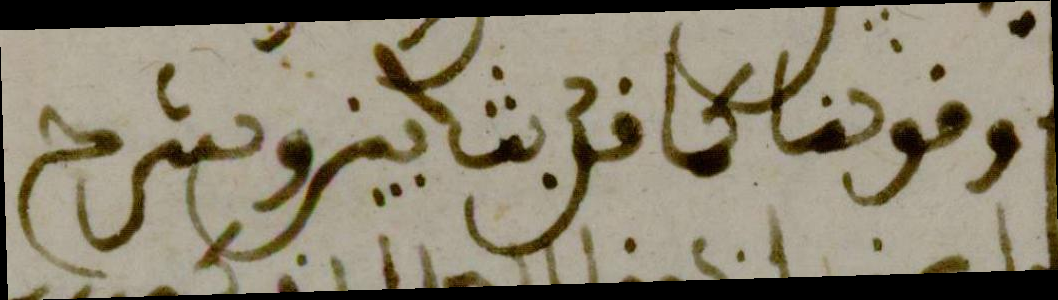وقولنا كما قد بث بين وشرح
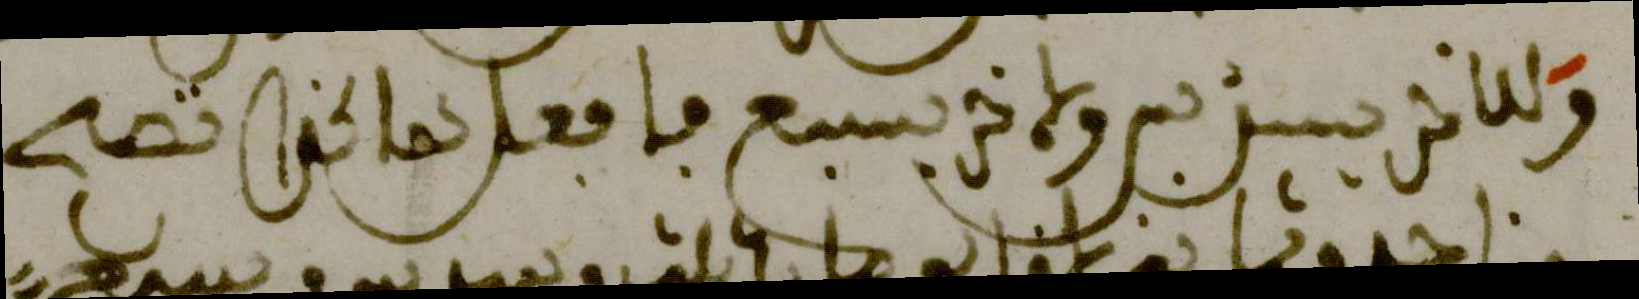وَللاخر بسدس ولاءخر بسبع فافعل هاكذا تصح
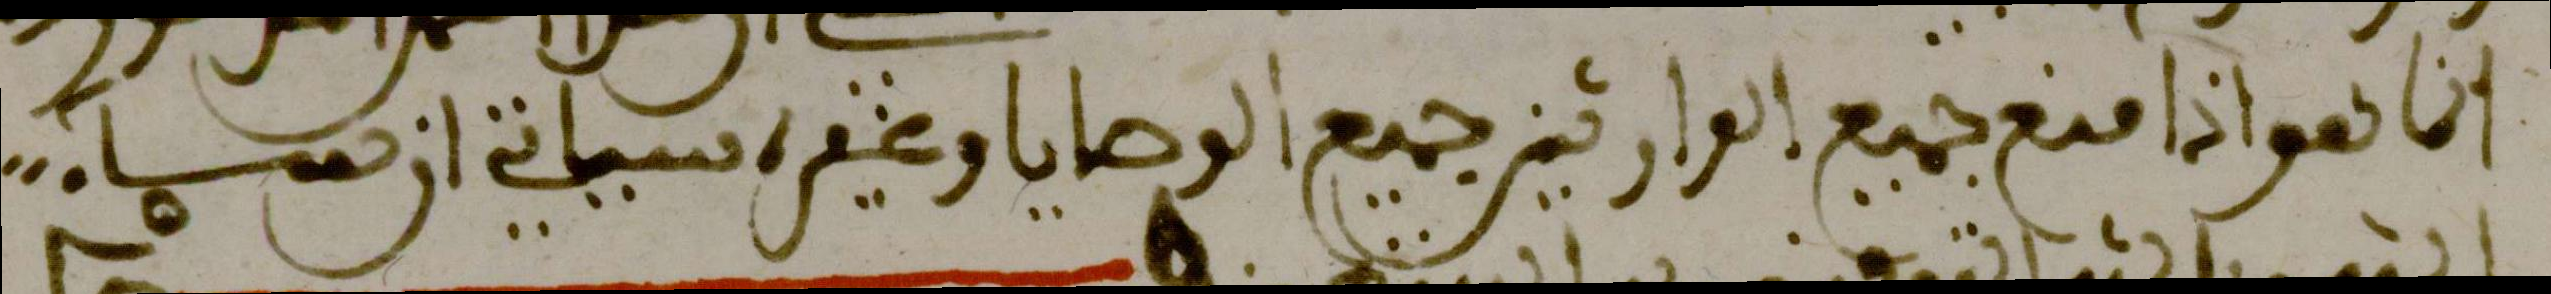انما هو اذا منع جميع الوارثين جميع الوصايا وغيره سياتي ان شاء
